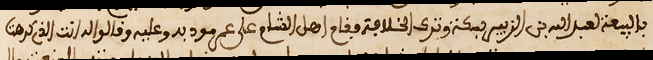بالبيعة لعبد الله بن الزبير بمكة وترك الخلافة فقام اهل الشان على عمر مودبه وعليه وقالوا له انت الذى كرهت
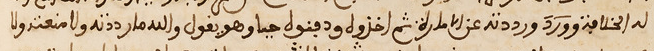له الخلافة وورد ورددته عن الامارة ثم اخذوه ودفنوه حيا وهو يقول والله ما رددته ولا منعته ولا
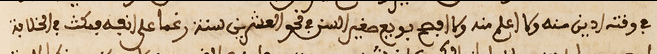في وقته ادين منه ولا اعلم منه ولا افصح بويع صغير السن في نحو العشرين سنة رغما على انفه فمكث ي الخلافة
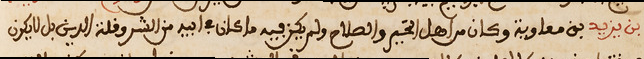بن يزيد بن معاوية وكان من اهل الخير والصلاح ولم يكن فيه ما كان في ابيه من الشر وقلة الدين بل لايكون
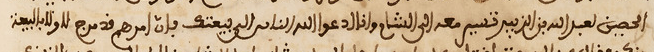الحصين لعبد الله بن الزبير تسير معه الى الشام وانا لدعوا الله الناس الى بيعتك فان امرهم قد مرج لا ولا بالبيعة
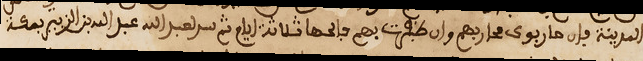المدينة فان حاربوك محاربهم وان ظفرت بهم فالحها ثلاثة ايام ثم سر لعبد الله عبد الله بن الزبير بمكة
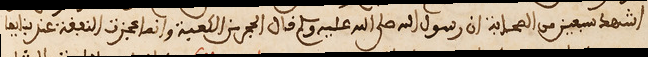اشهد سبعين من الصحابة ان رسول الله صلى الله عليه وسلم قال الحجر من الكعبة وانما عجزت النفقة عند بنايها
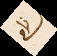نام
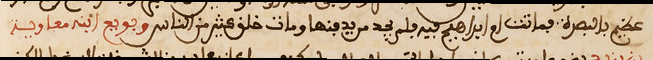عظيم بالبصرة فماتت ام ابراهيم فيه فلم يجد من يدفنها ومات خلق كثير من الناس وبويع ابنه معاوية
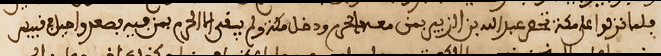فلما نزلوا على مكة تحصن عبد الله بن الزبير بمن معه بالحرم ودخل مكة ولم يبقى الا الحرم بمن فيه فصعدوا جبل في قبيس
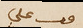قف على
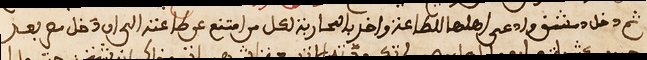ثم دخل دمشق وادعى اهلها للطاعة واخر بالمحاربة لكل من امتنع عن طاعته الى ان دخل مصر بعد
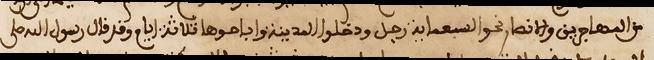من المهاجرين والانصار نحو السبعماية رجل ودخلوا المدينة واباحوها ثلاثة ايام وقد قال رسول الله صلى
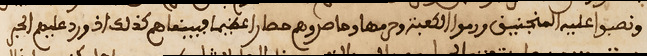ونصبوا عليه المنجنيق ورموا الكعبة وحرمها وحصارا عظيما فبينماهم كذلك اذورد عليهم الحبر
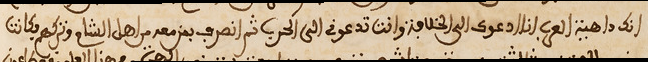انك داهية العرب انا ادعوك الى الخلافة وانت تدعونى الى الحرب ثم انصرف بمن معه من اهل الشام وتركهم فكانت
